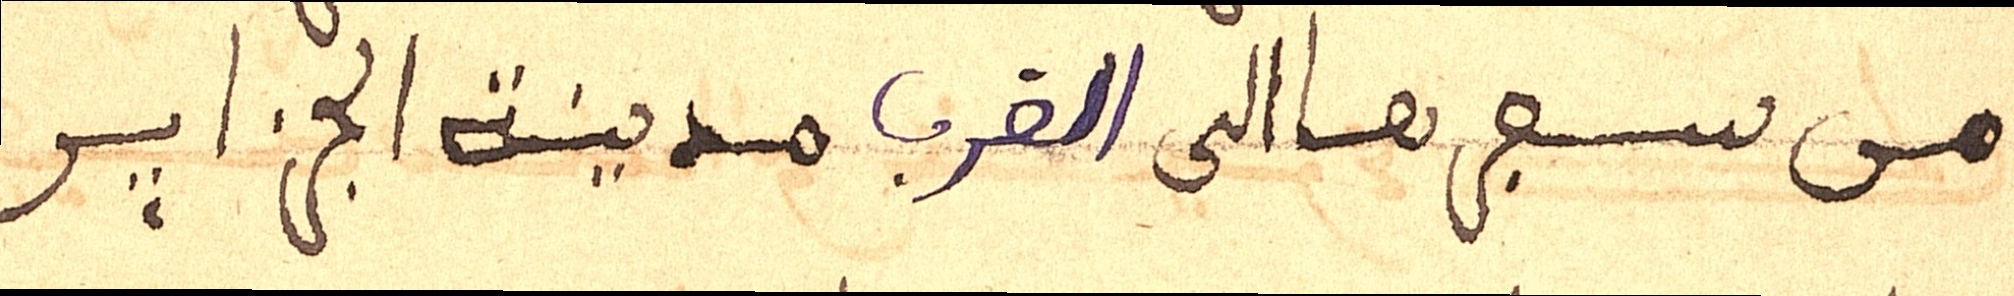من سفرها الى القرب مدينة الجزائر
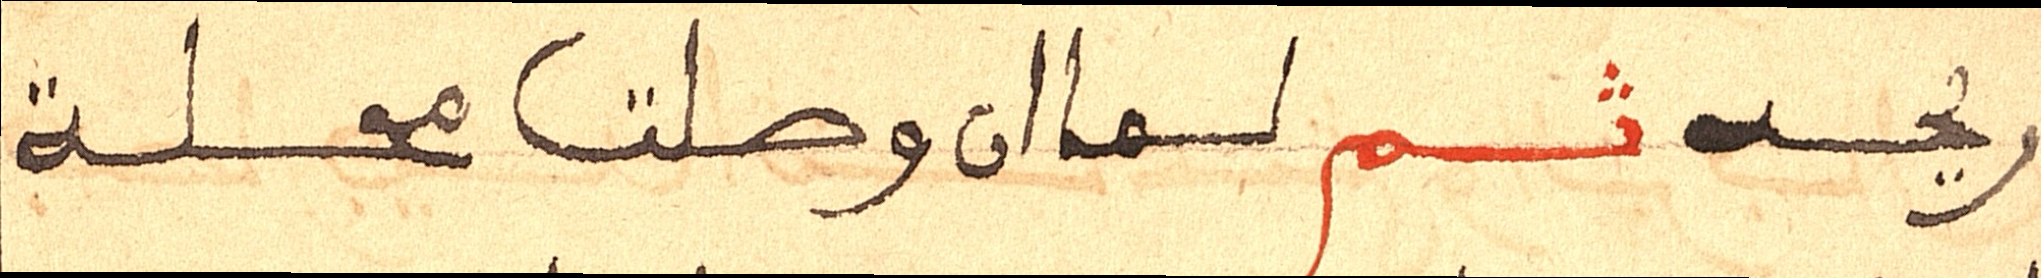ريحه ثم لما ان وصلت محلة
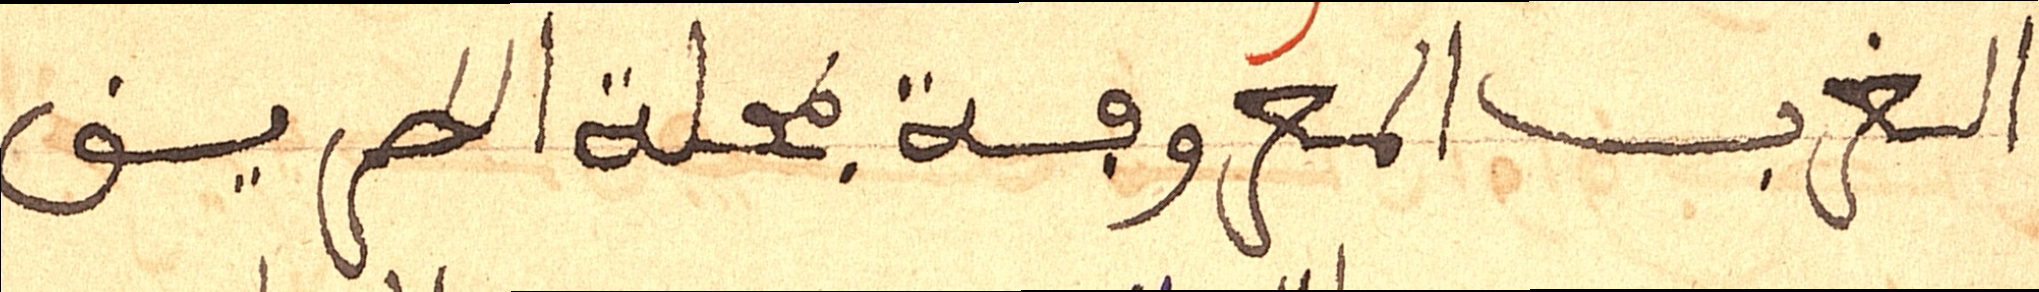الغرب المعروفة بمحلة الصريق
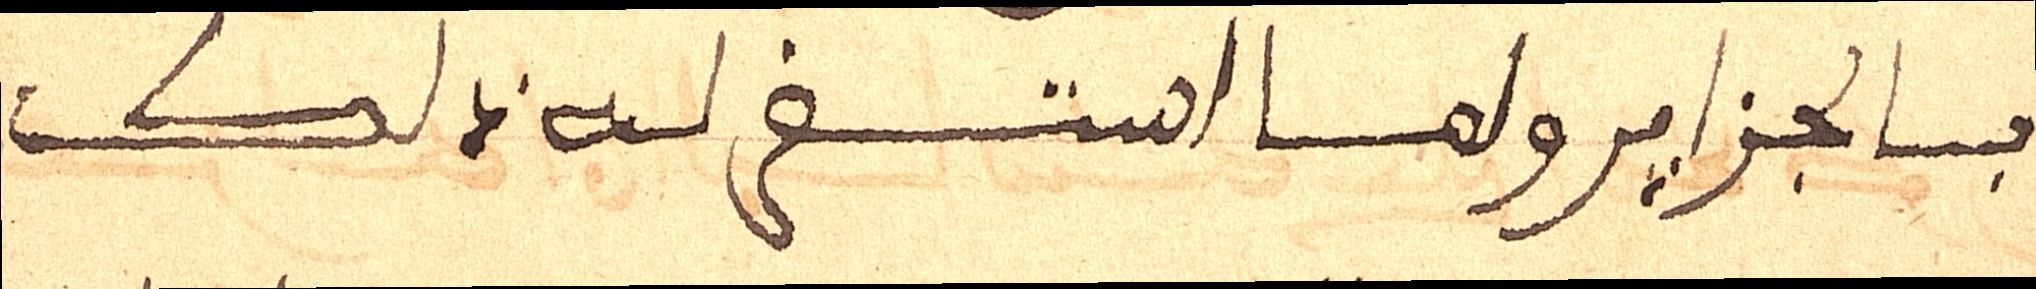بالجزائر ولما استقر له ذلك
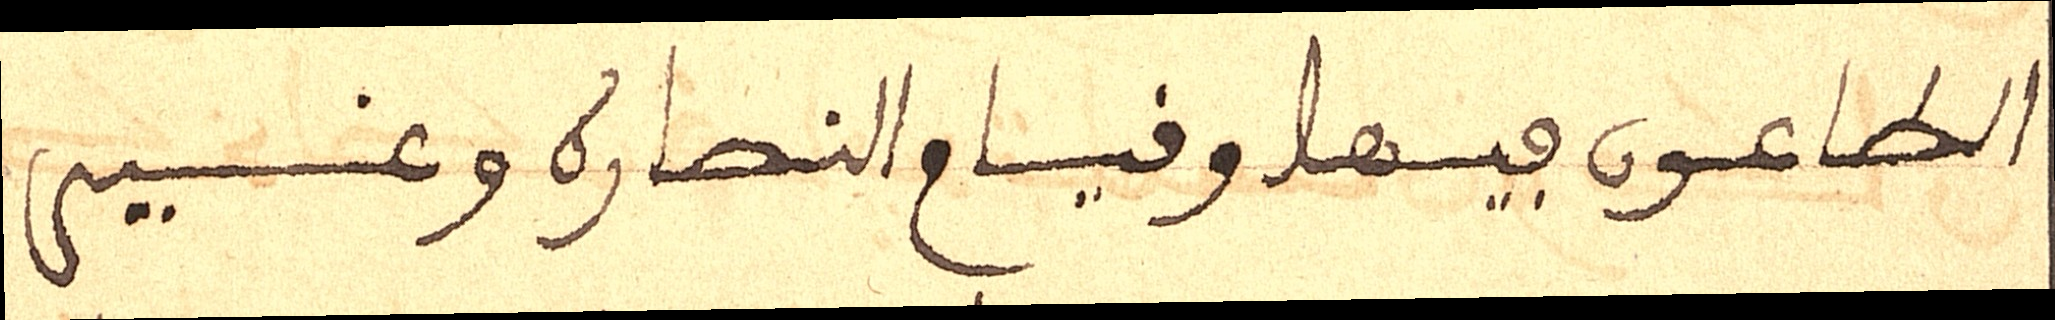الطاعون فيها وقيام النصاره وغير
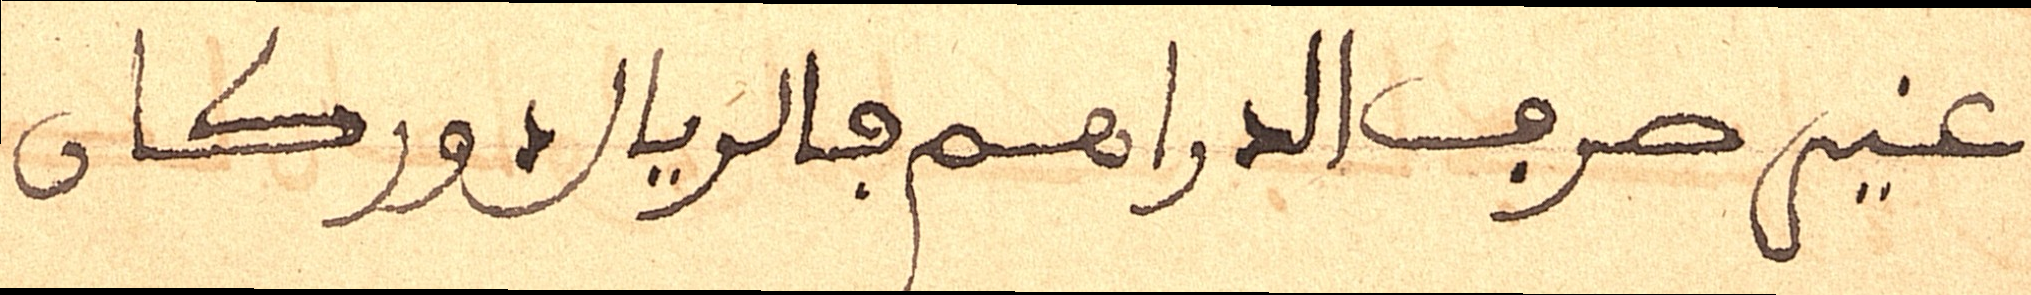غير صرف الدراهم فالريال دور كان
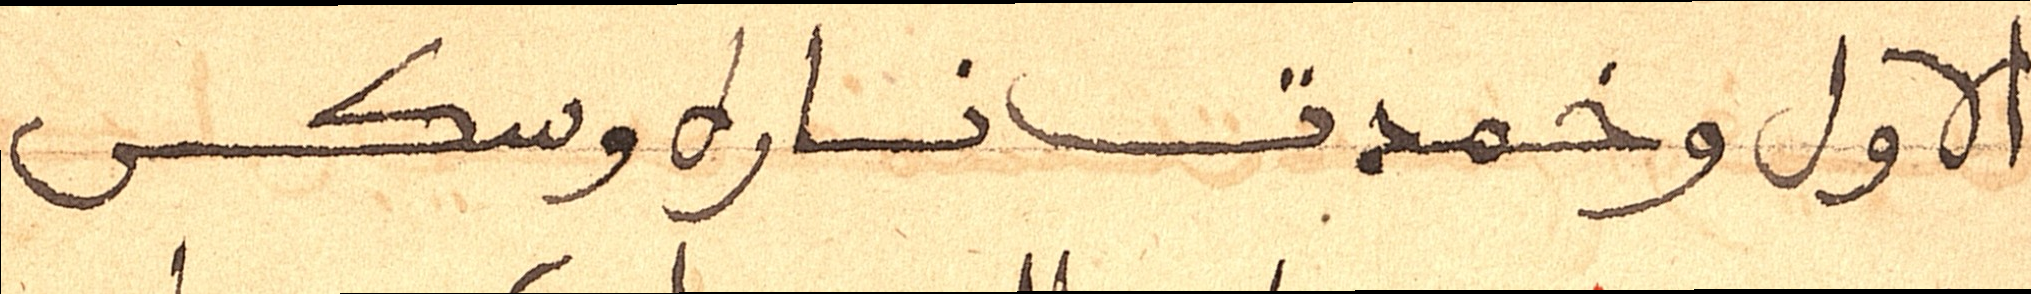الاول وخمدت ناره سكن
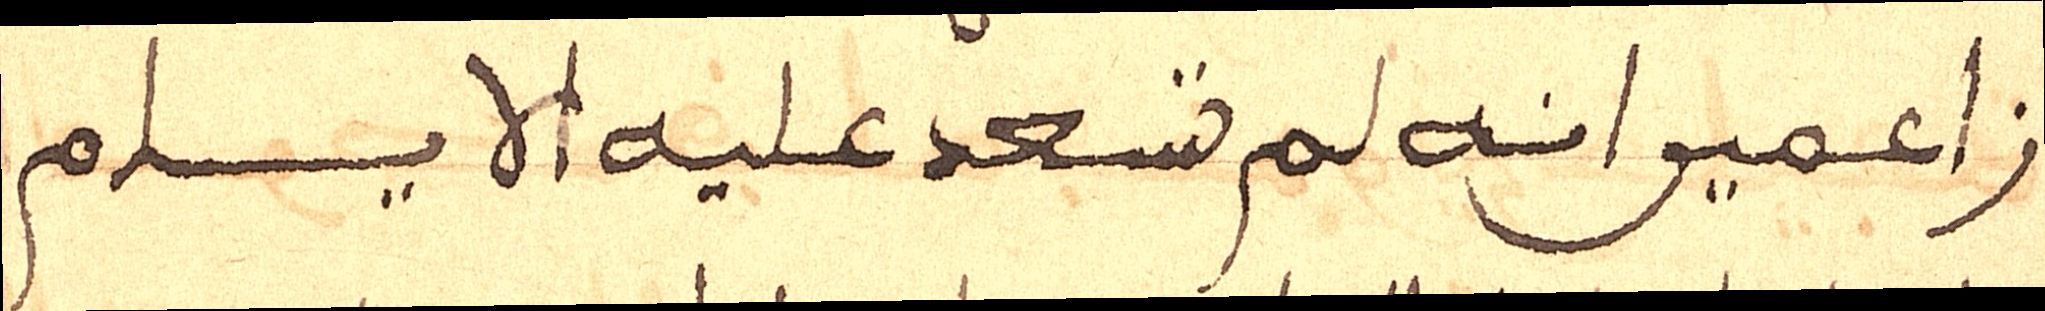زاعمين انه لم تسعد عليه الا يام
